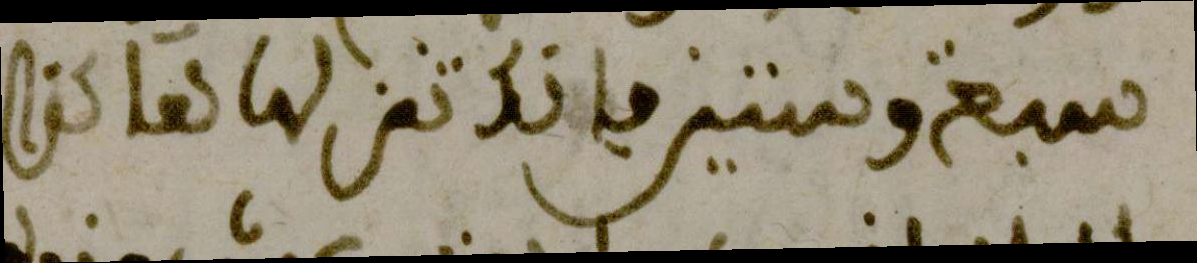سبعة وستين فانك تنزلها هاكذا
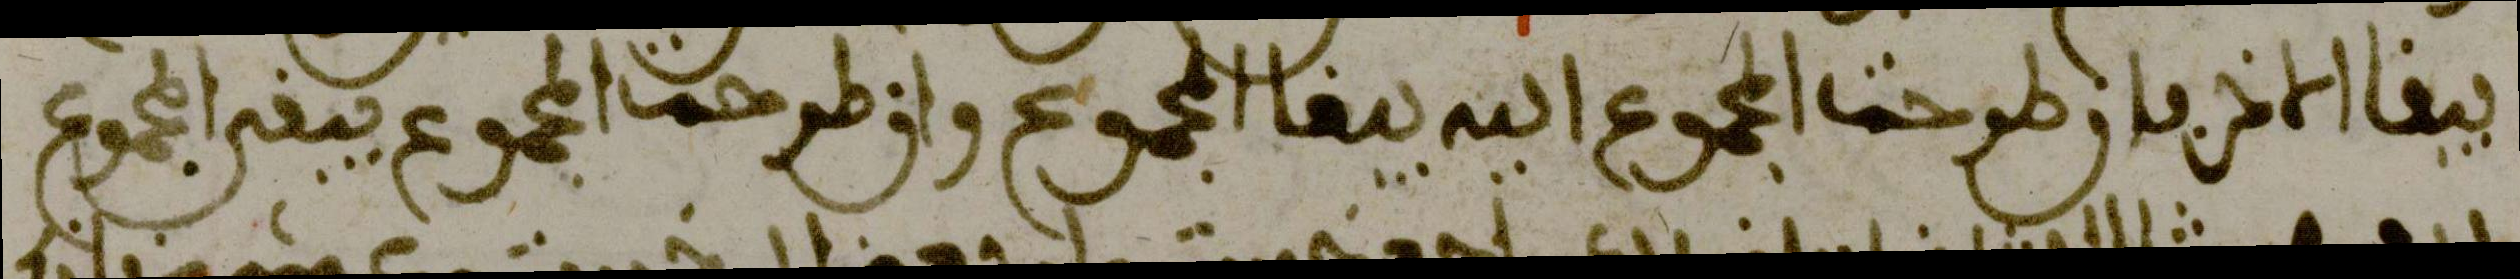يبقا الاخر فان طرحت المجموع اليه يبقا المجموع وان طرحت المجموع يبقى المجموع
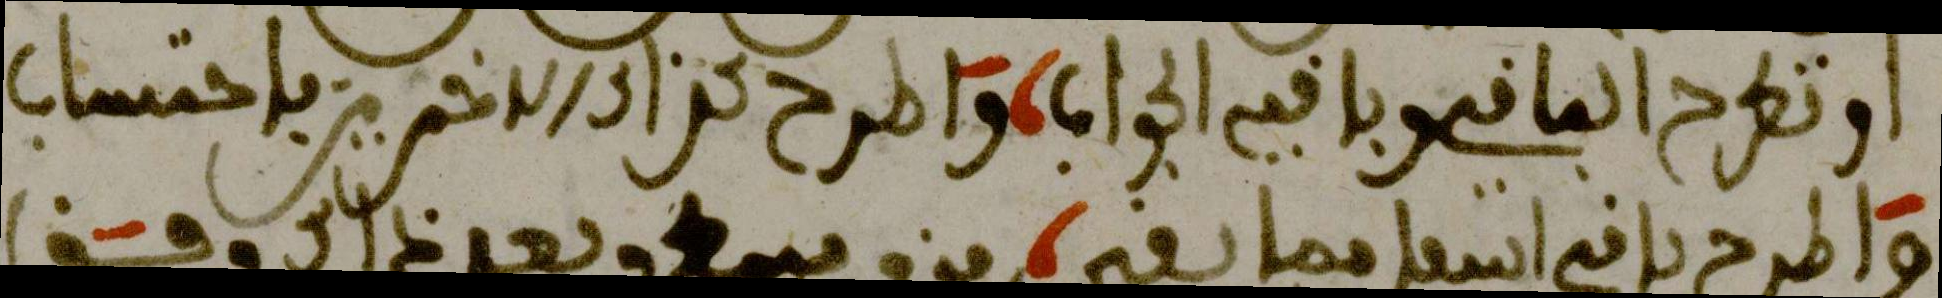او تطرح الباقي وباقيه الجواب وَاطرح كذاك الاخرين باحتساب
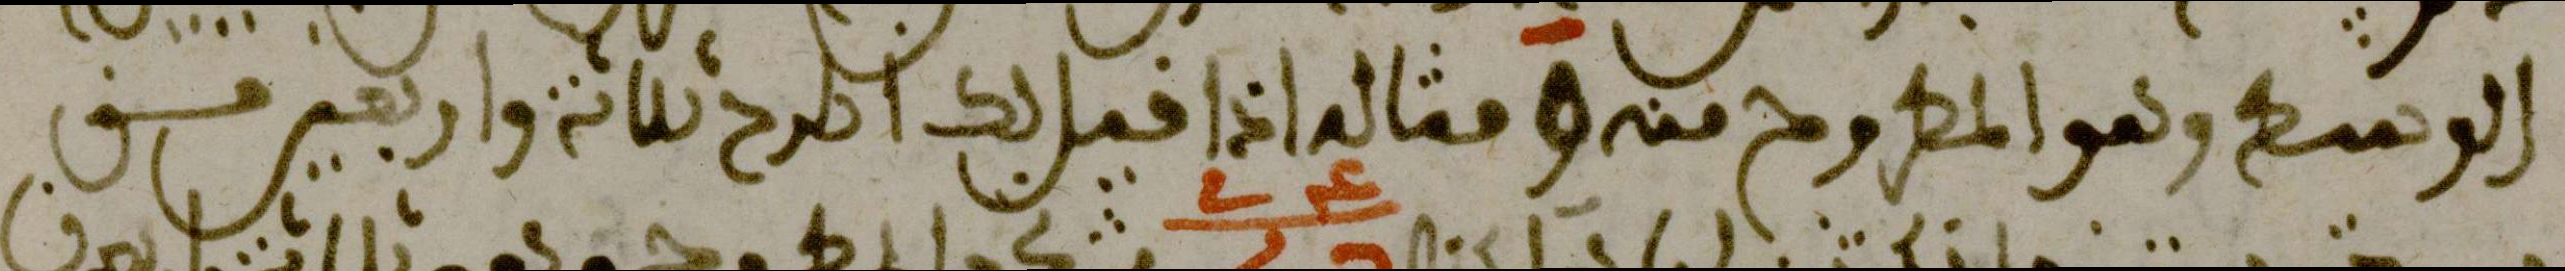الوسط وهو المطروح منه و مثاله اذا قيل لك اطرح ثلاثة واربعين من
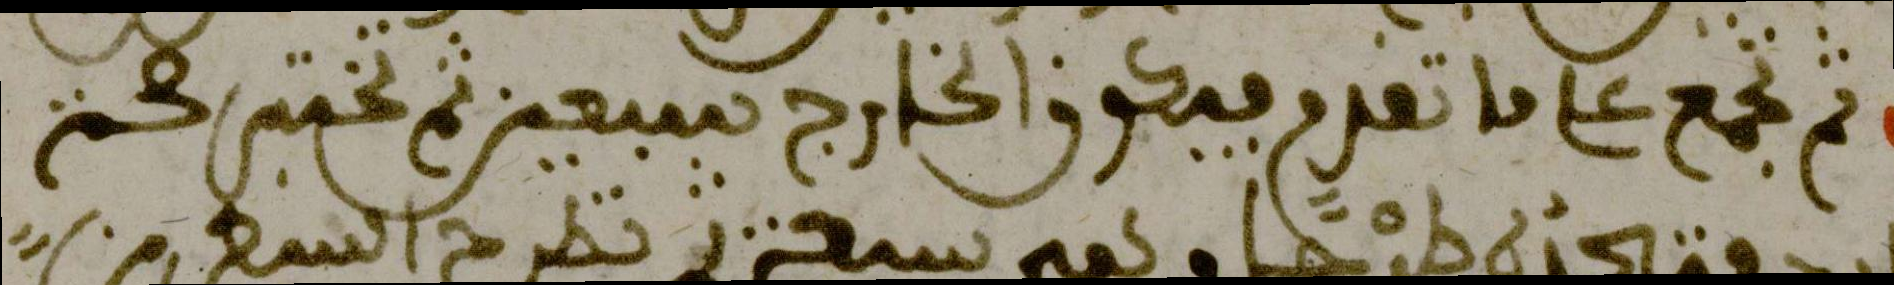ثم تجمع على ما تقدم فيكون الخارج سبعين ثم تختبر صحة
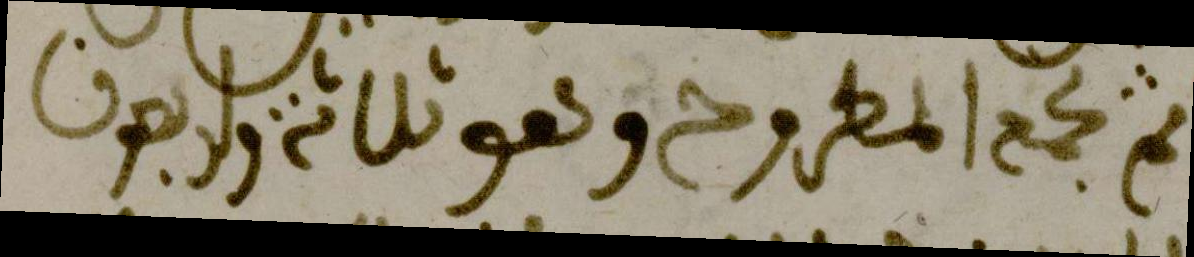ثم تجمع المطروح وهو ثلاثة واربعون
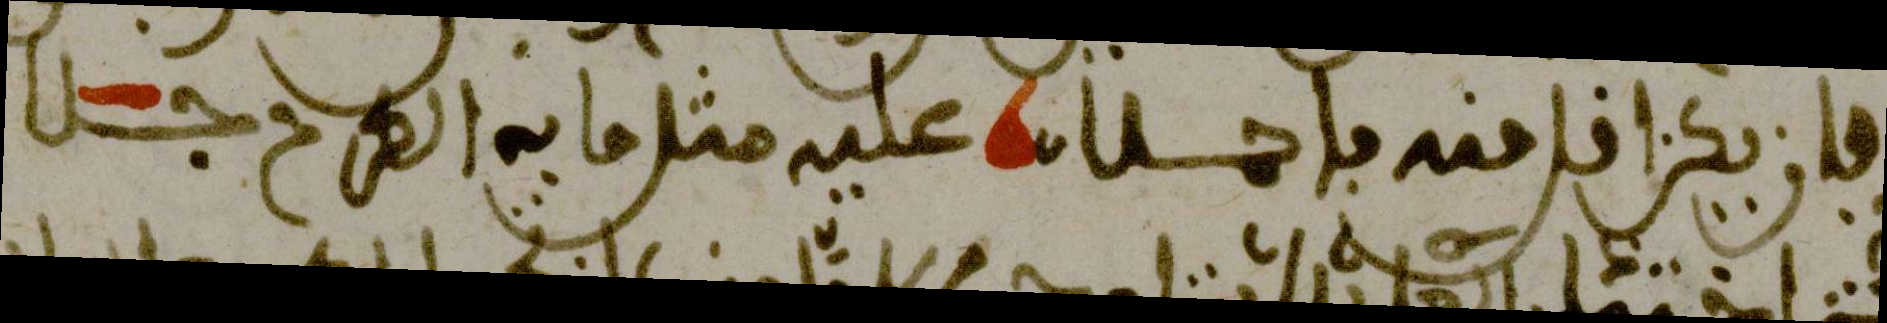فان يكن اقل منه فاحملا عليه ما به الطرح جلا
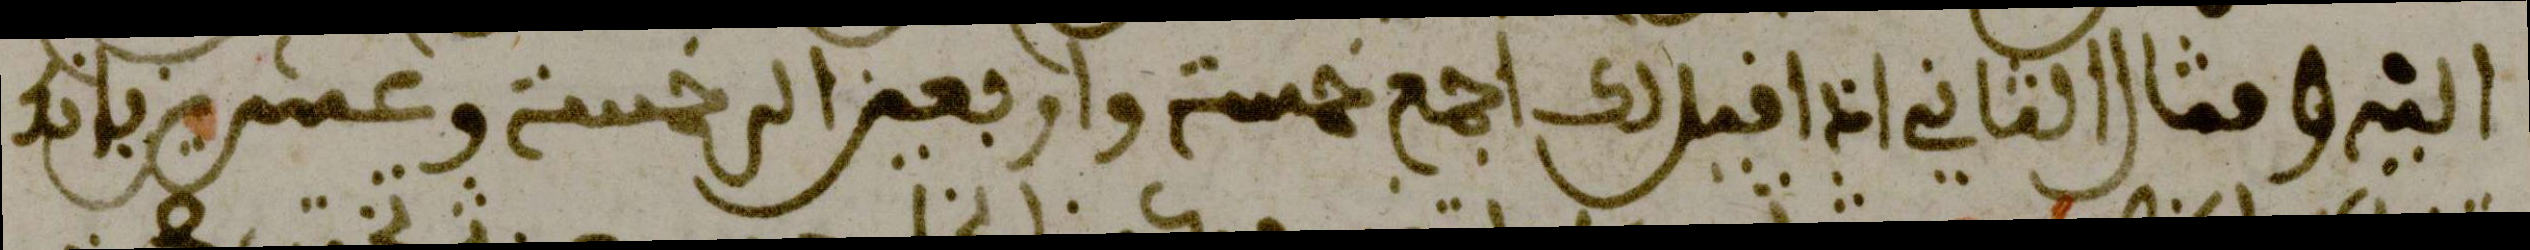اليْه ومثال الثاني اذا قيل لك اجمع خمسة واربعين الى خمسة و عشرين فانك
